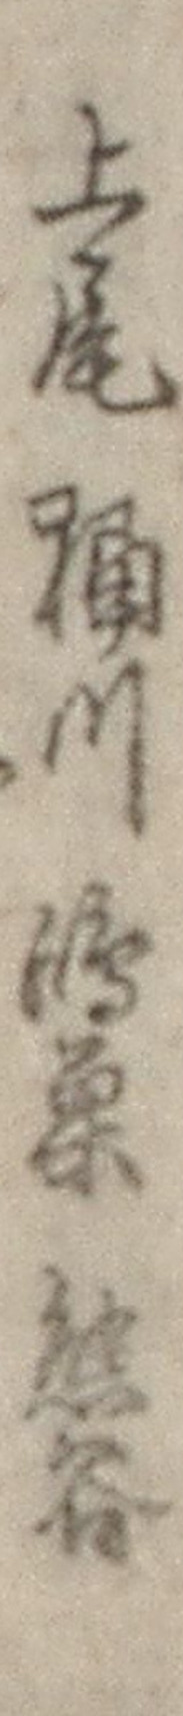上尾桶川鴻巣熊谷
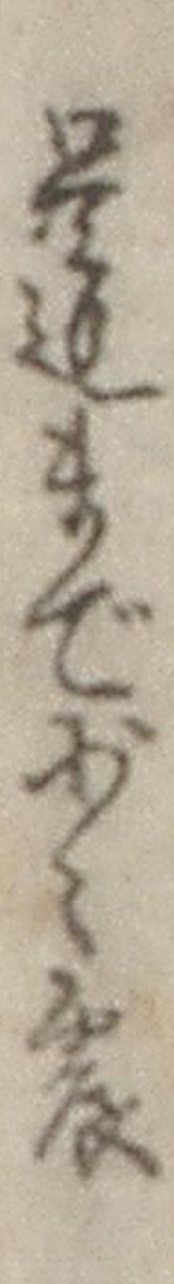是辺まで少〻震
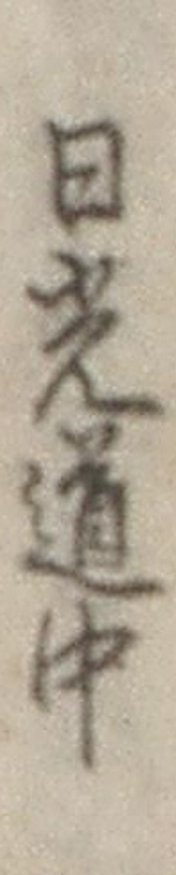日光道中
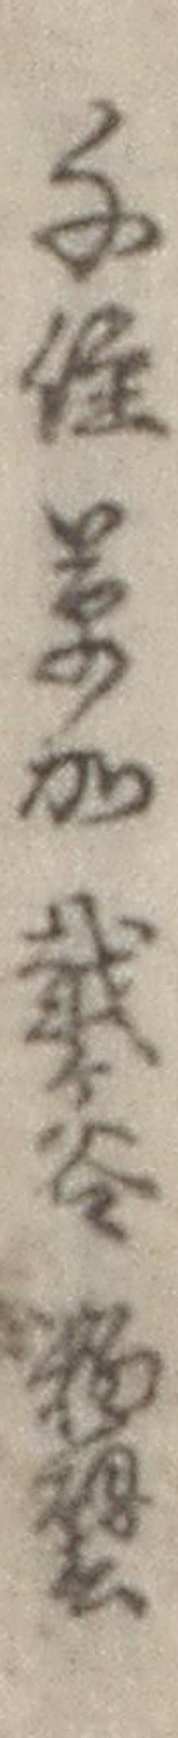千住草加越ケ谷柏壁
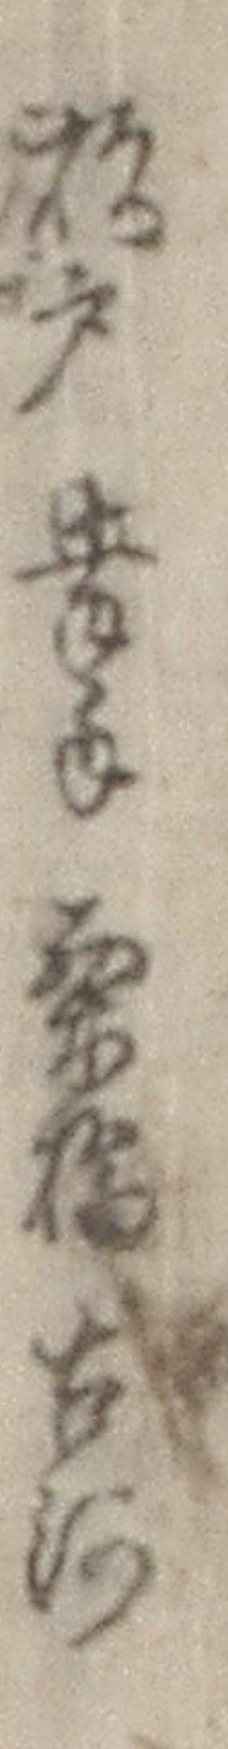杉戸幸手栗橋古河
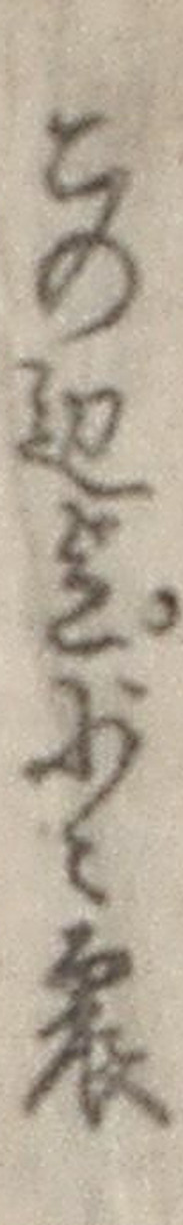この辺迄少〻震
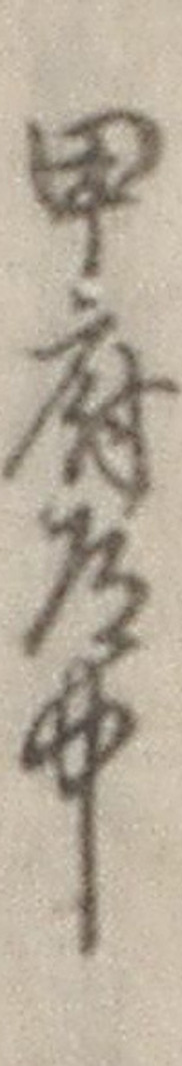甲府道中
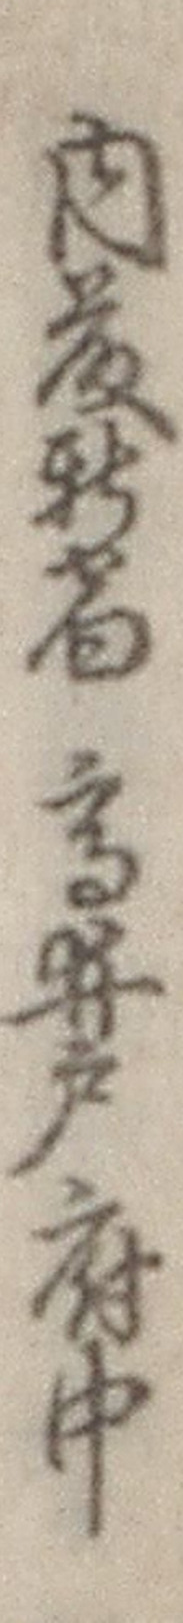内藤新宿高井戸府中
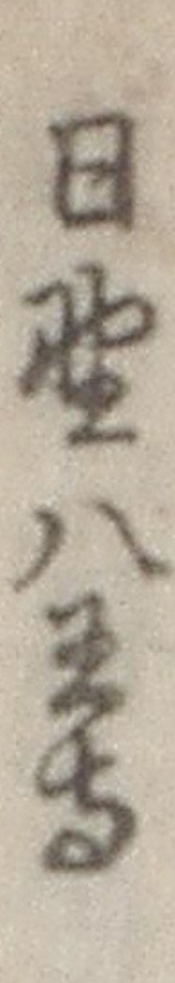日野八王寺
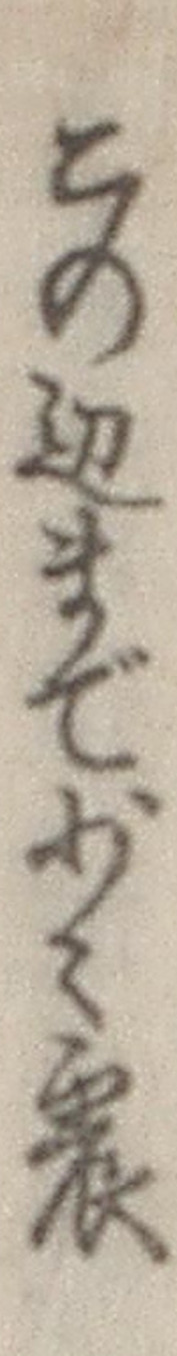この辺まで少〻震
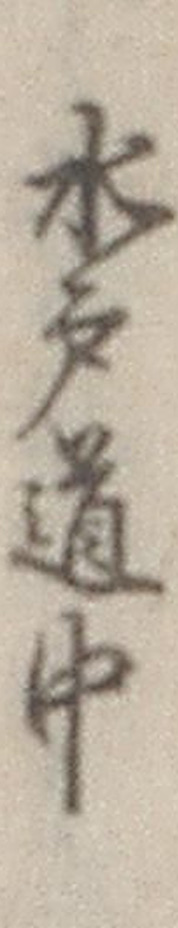水戸道中
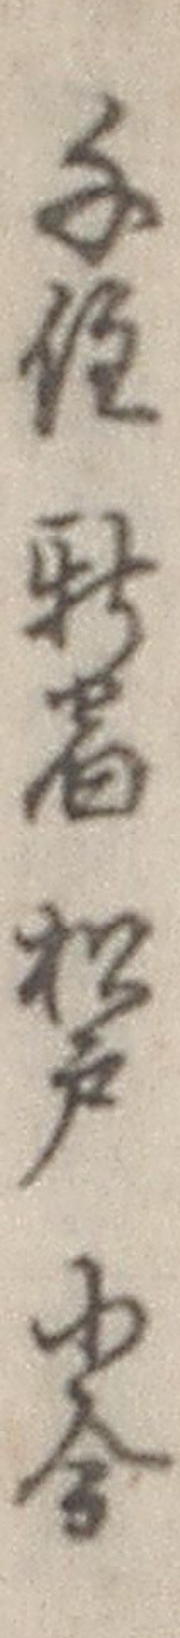千住新宿松戸小金
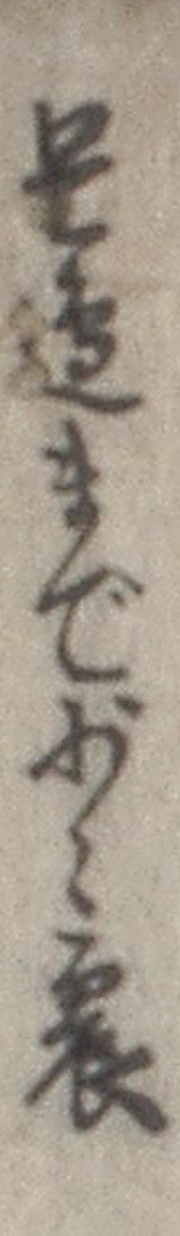是辺まで少〻震
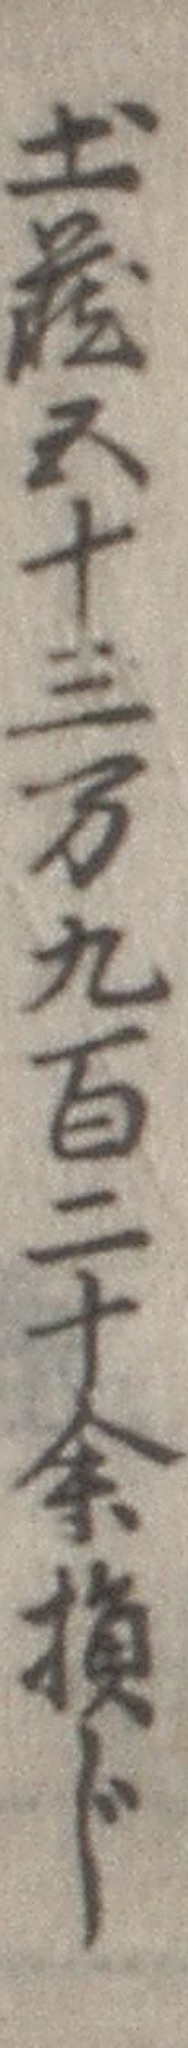土蔵五十三万九百二十余損じ
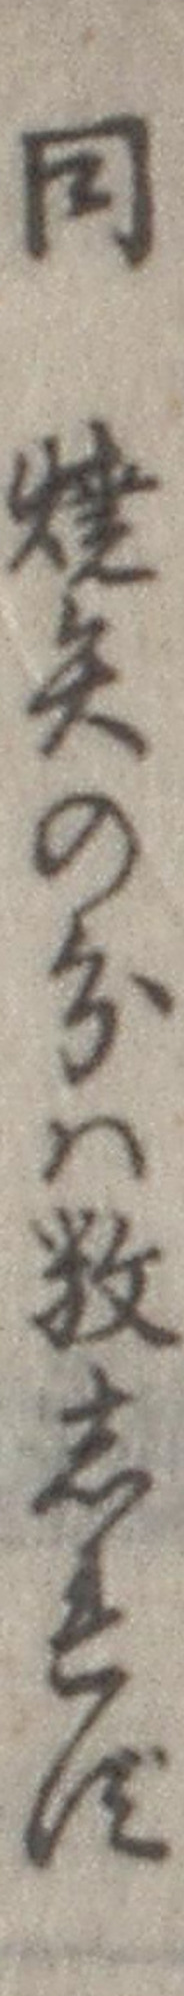同消失の分ハ数しれず
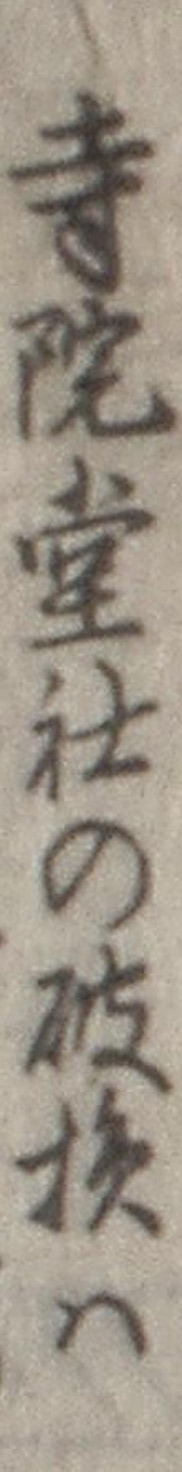寺院堂社の破損ハ
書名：江戸　大地震臣細録　全
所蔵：東京大学地震研究所図書室 Earthquake Research Institute Library, The University of Tokyo, JAPAN
